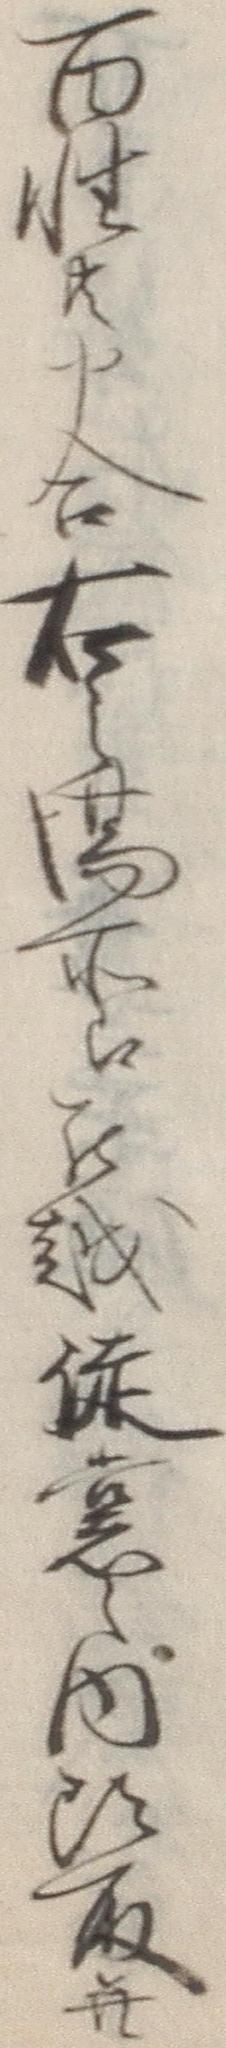百姓共申合右之場所え罷越徒党之内頭取并
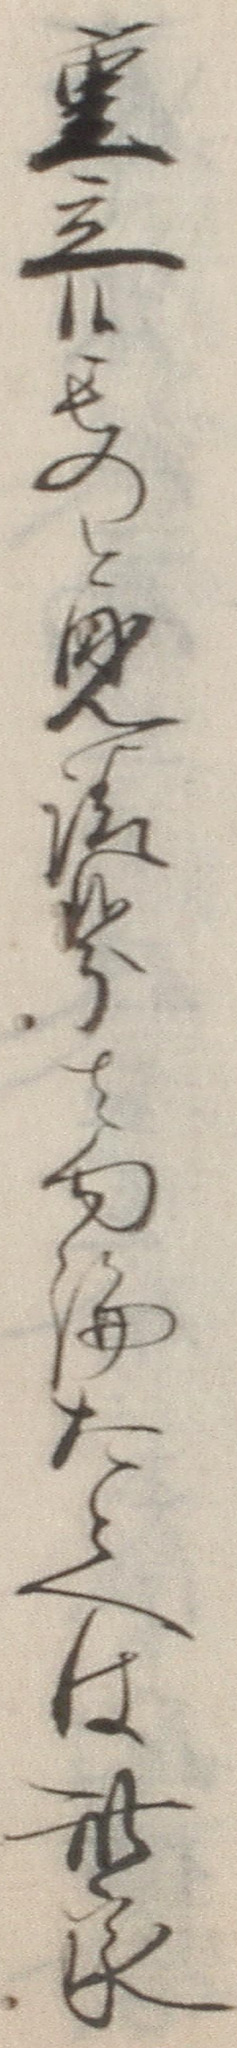重立候ものと見請候分は勿論たとへは此家
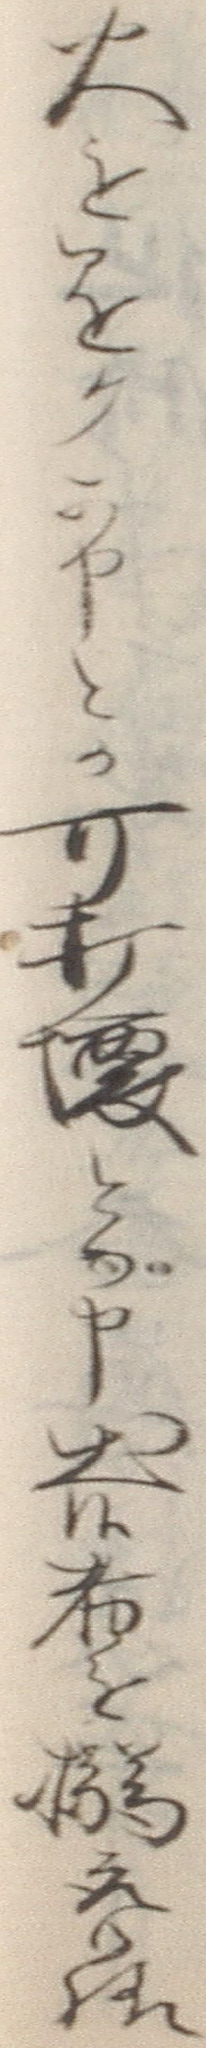火を懸ケ可申との可打壊とか申出候者を搦取候様
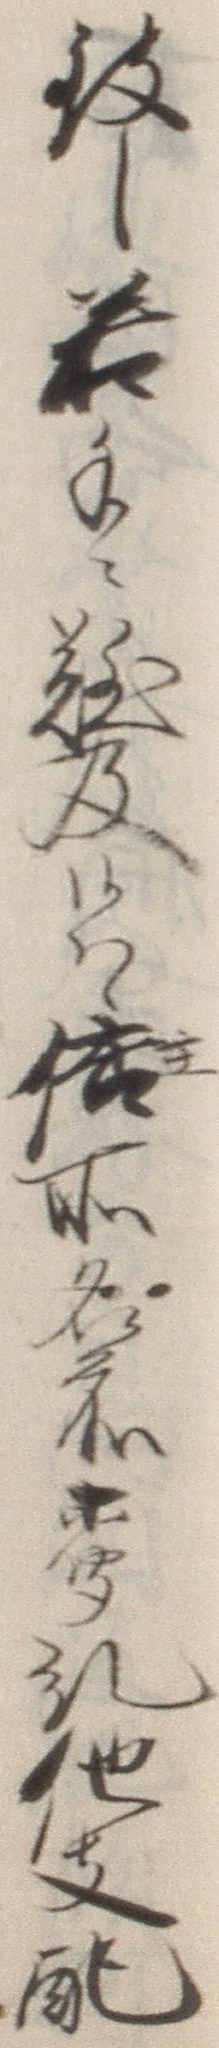致し若手ニ難及候ハゝ住所名前等聞糺他支配
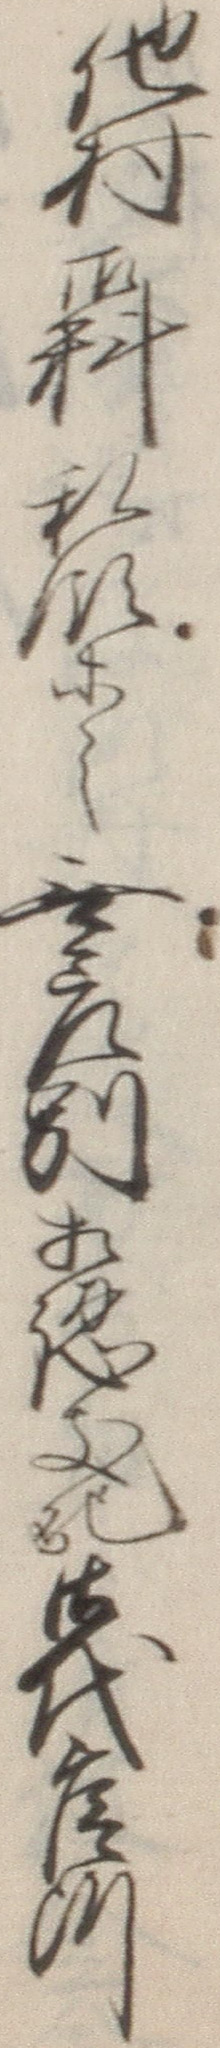他村御料私領等之無差別相認支配御代官所
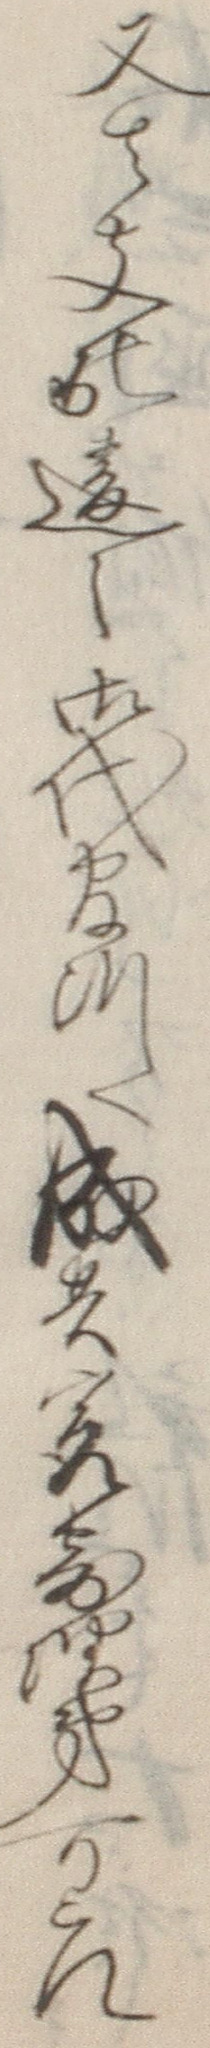又は支配違之御代官所へ成共最寄次第可差
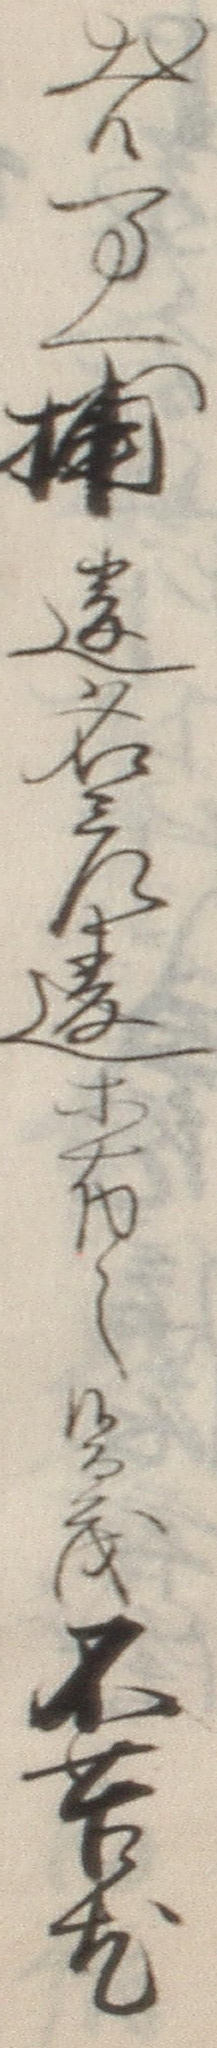出候事捕違名差違等有之候而も不苦尤
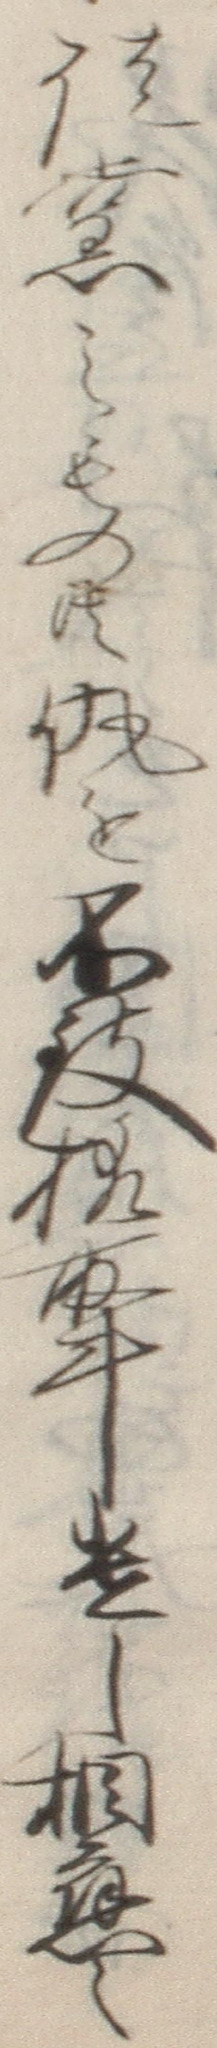徒党之もの共仇を不致様取斗遣し相応之
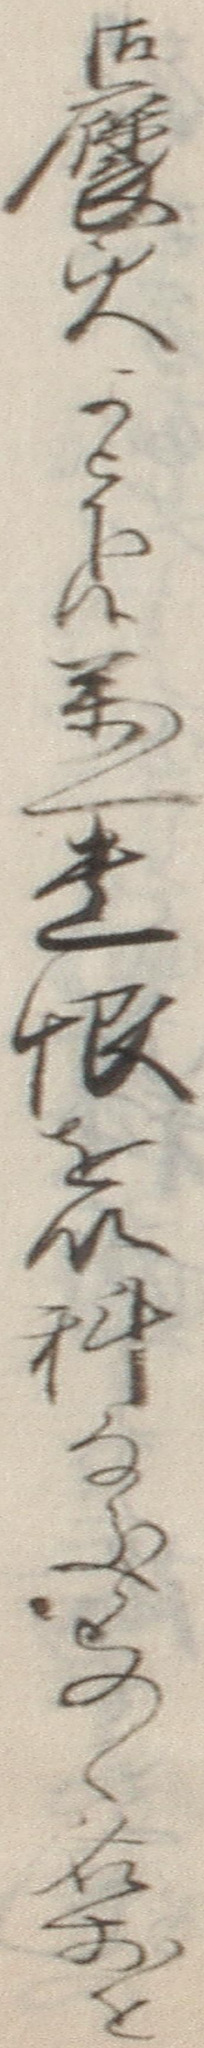御褒美可被下候万一巻帳を以科なしものへ名前を
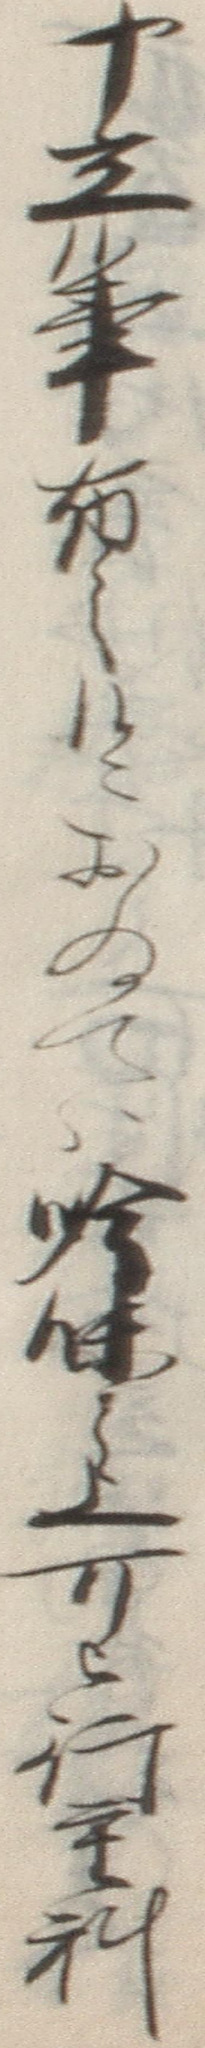申立候事有之候ニおいてハ吟味之上可被行重科
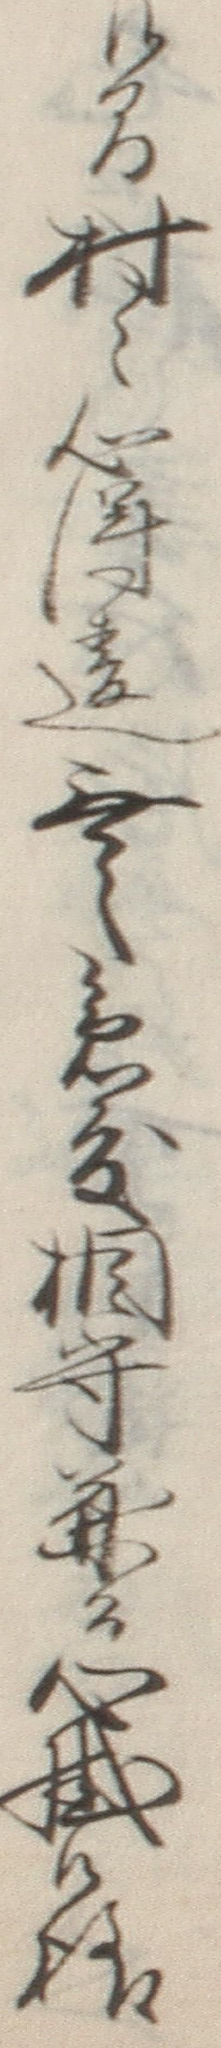候間村々心得違無之急度相守兼而心掛候様
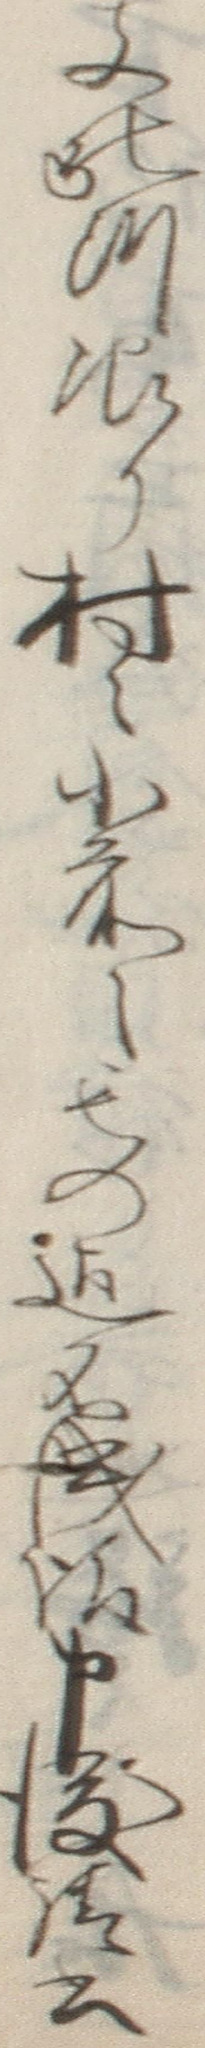支配所限り村々小前之もの迄不漏様申渡請書

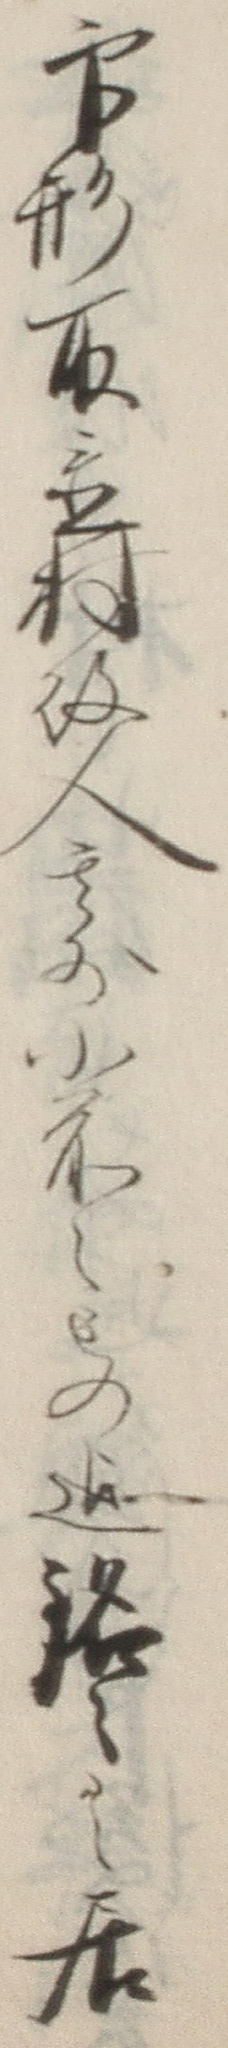印形取置村役人其外小前之者迄銘々居
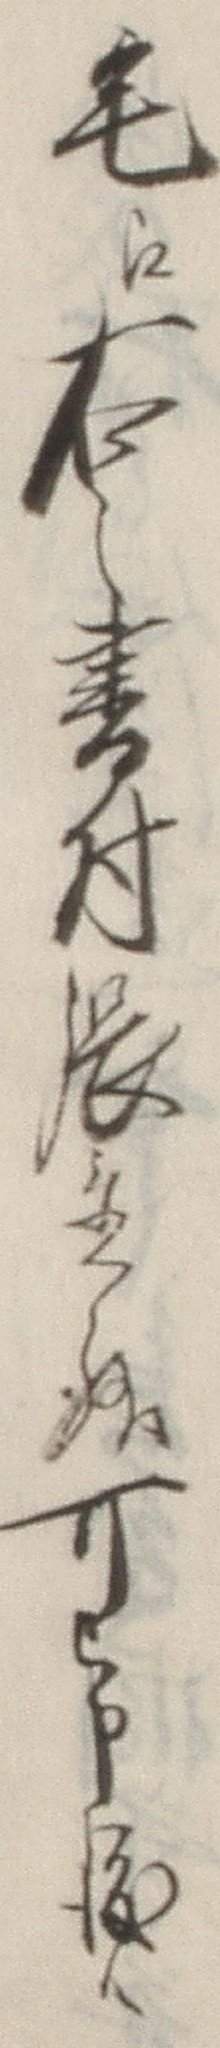宅え右之書付張置候様可被申渡候
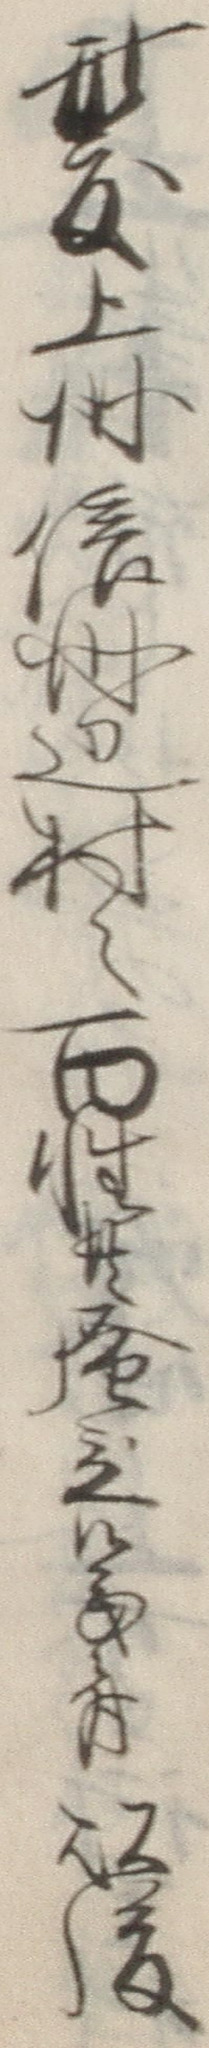此度上州信州辺村々百姓共騒立候義ニ付以後
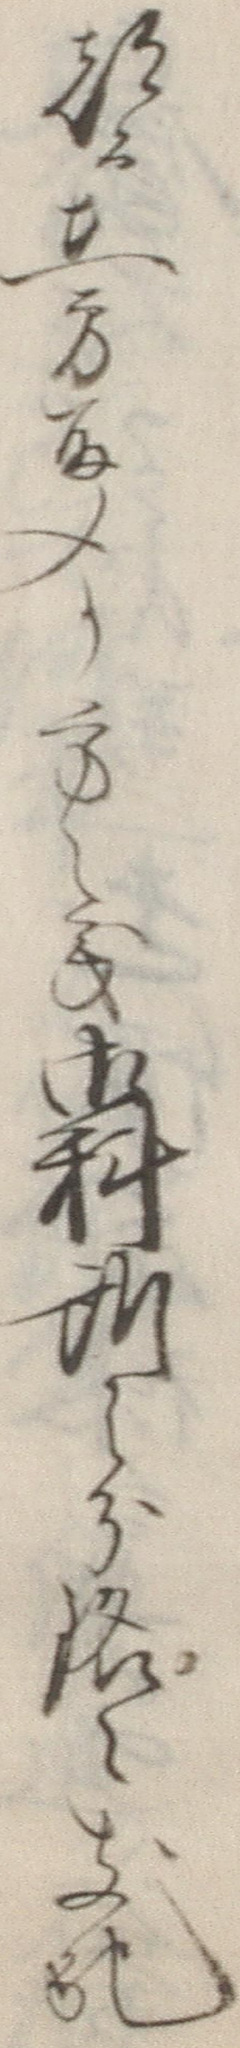都而在方取〆り方之義御料所之分銘々支配
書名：[諸国災害記録]
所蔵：東京大学地震研究所図書室 Earthquake Research Institute Library, The University of Tokyo, JAPAN
